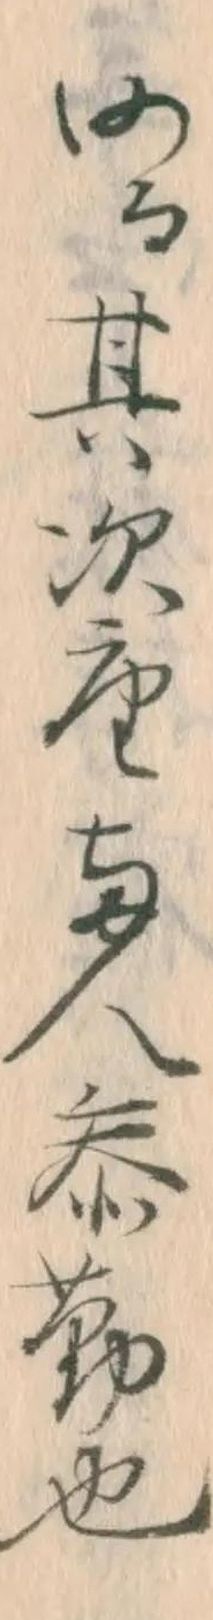仍而其次席両人参勤也
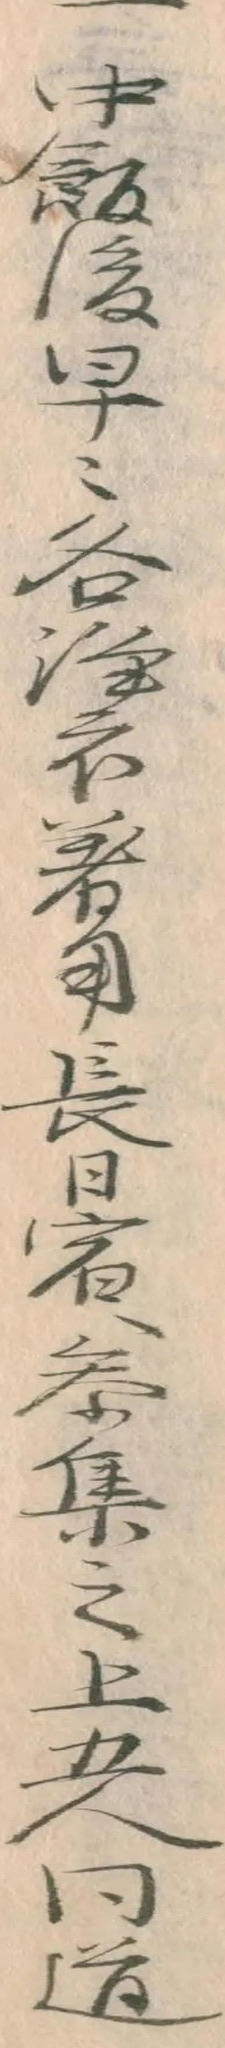一中飯後早々各浄衣着用長日宿へ参集之上五人同道
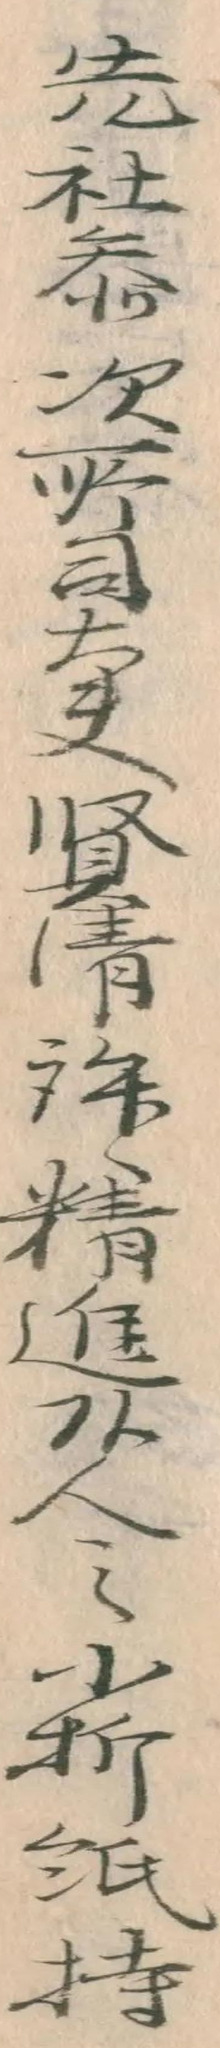先社参次所司大夫賢清許ヘ精進頭人之小折紙持
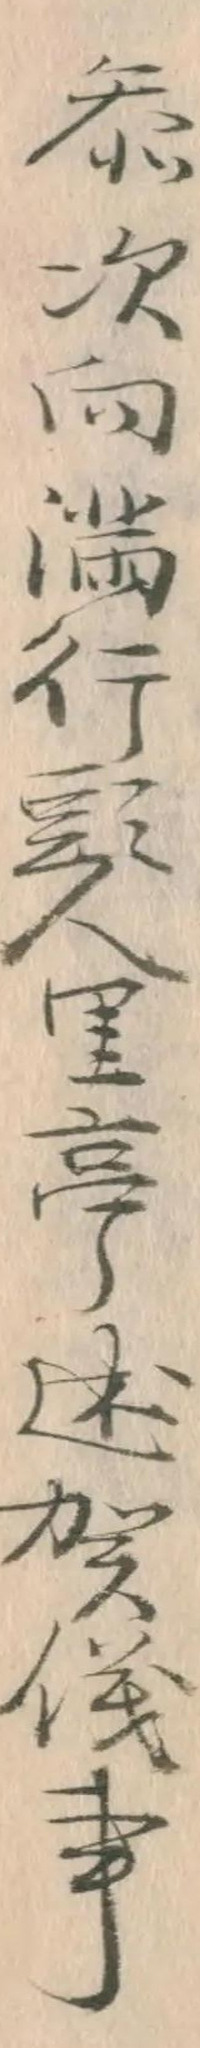参次向満行頭人里亭述賀儀事
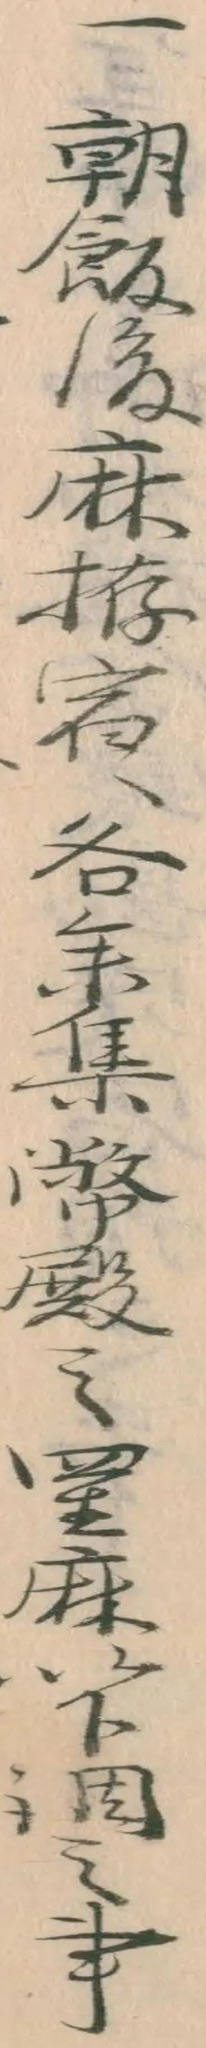一朝飯後麻拵宿へ各参集幣殿之置麻以下調之事
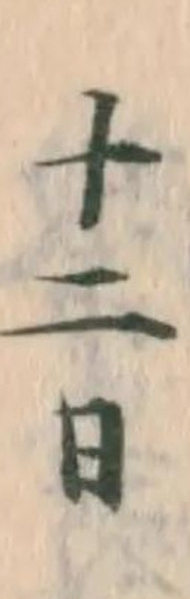十二日
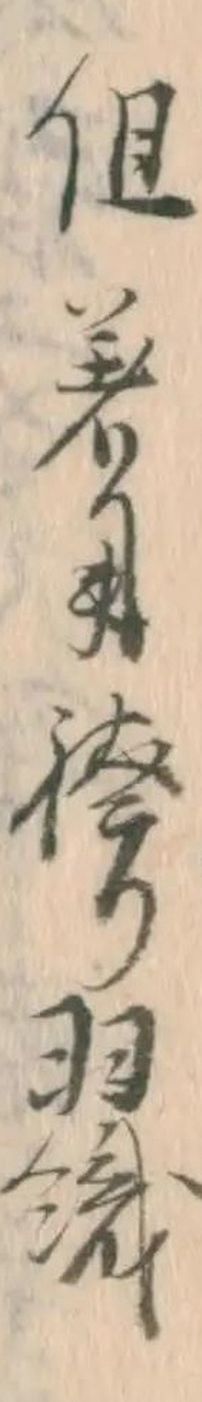但着用袴羽織
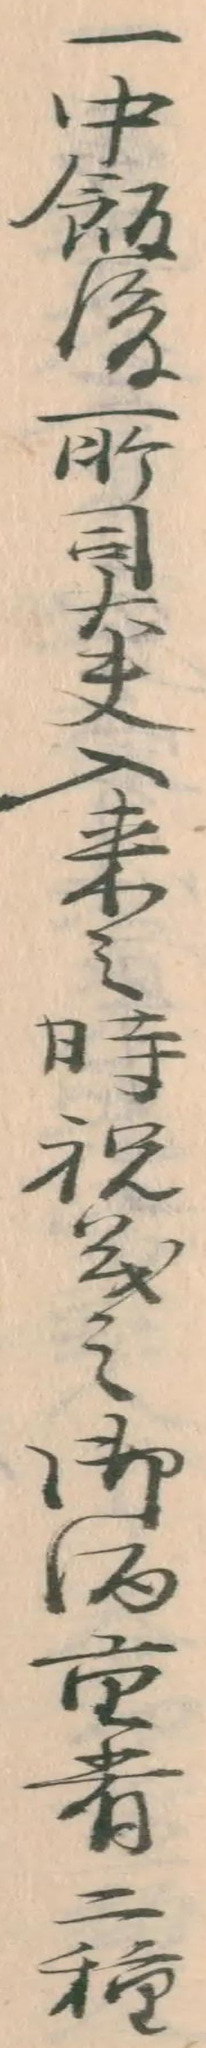一中飯後所司大夫入来之時祝義之御酒重肴二種
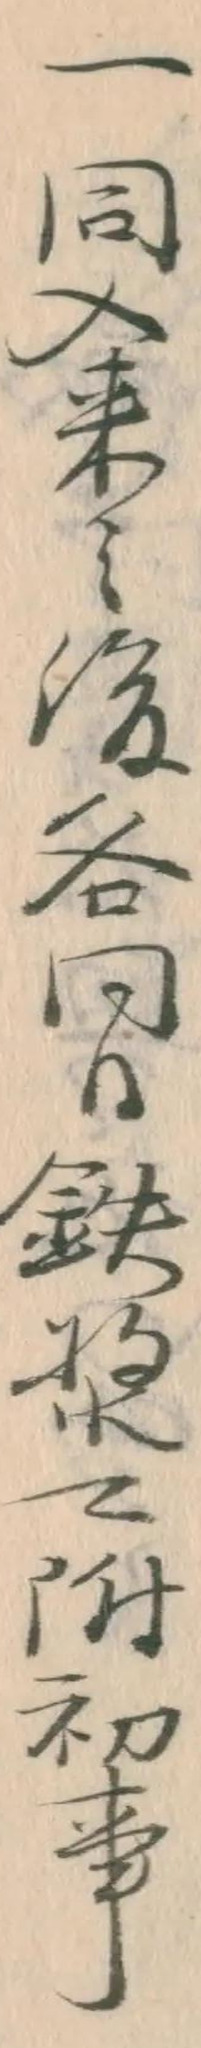一同入来之後各同日鉄漿可附初事
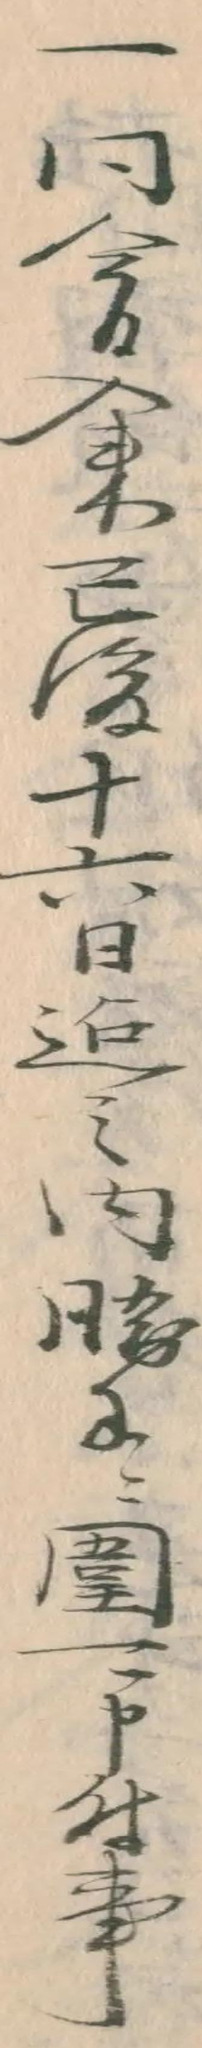一同今日入来已後十六日迄之内勝手ニ圍可申付事
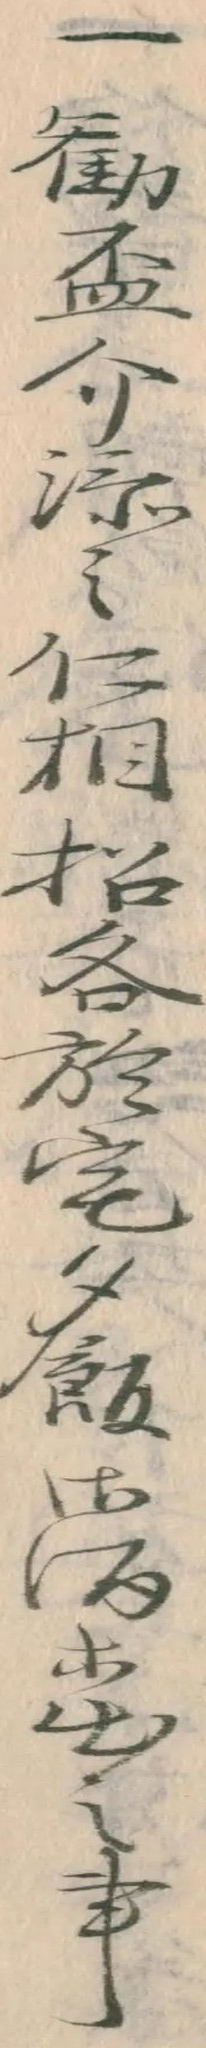一勧盃介添之仁相招各於宅夕飯御酒等出之事
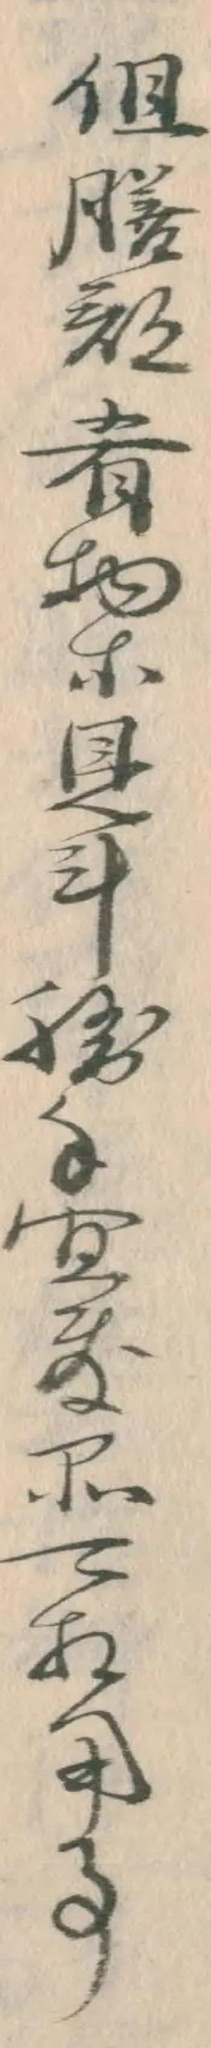但膳部肴物等見斗勝手宜敷品可相用事
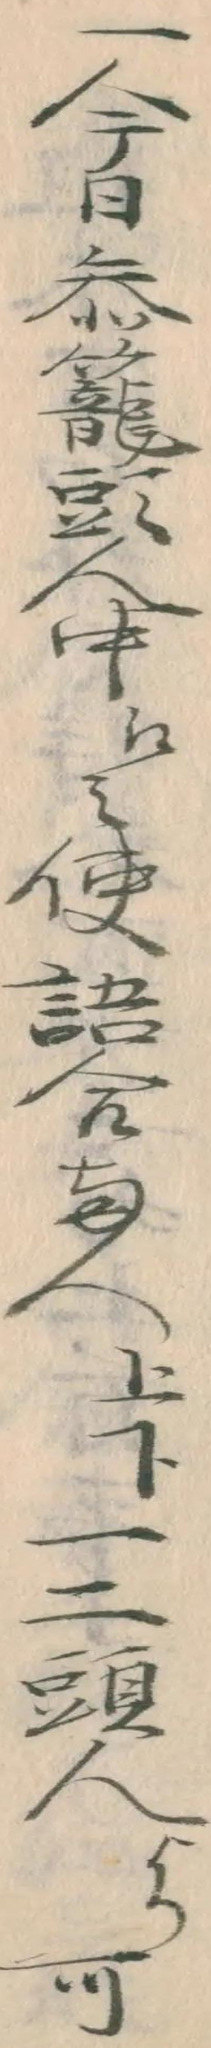一今日参籠頭人中江之使語合両人上下一二頭人より可
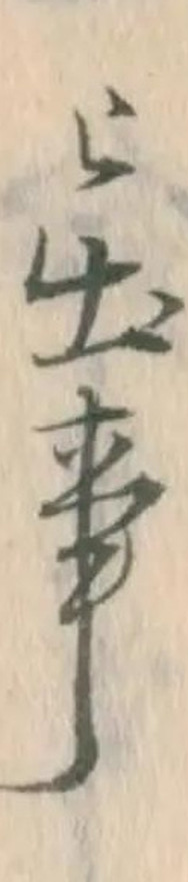被出事
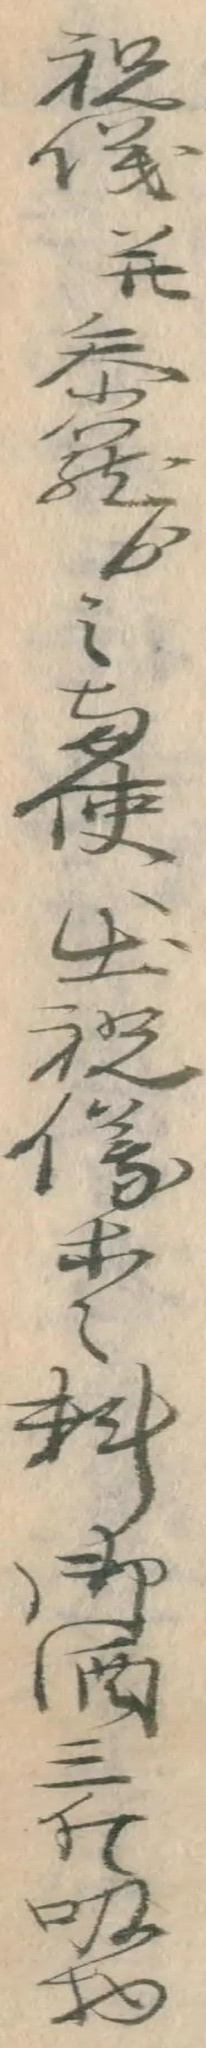祝儀并参籠ゟ之両使へ出祝儀等之料御酒三升吸物

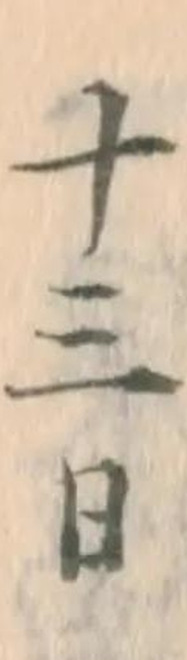十三日
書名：賀茂社記録. 第72冊
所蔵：国立国会図書館 National Diet Library, JAPAN
